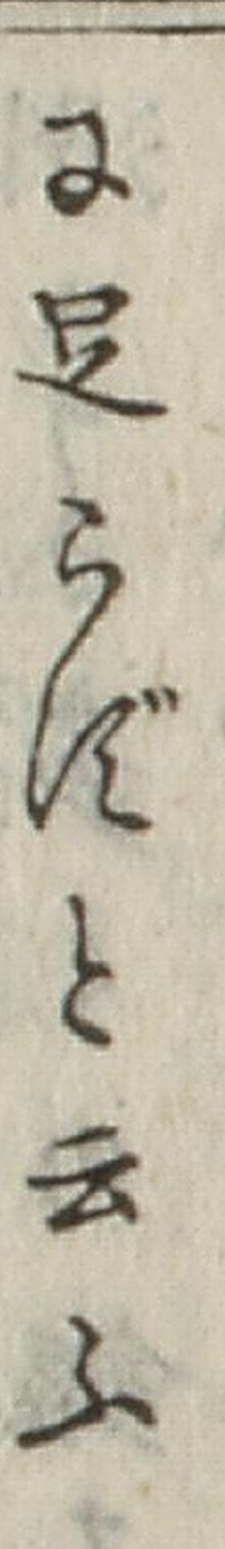に足らずと云ふ
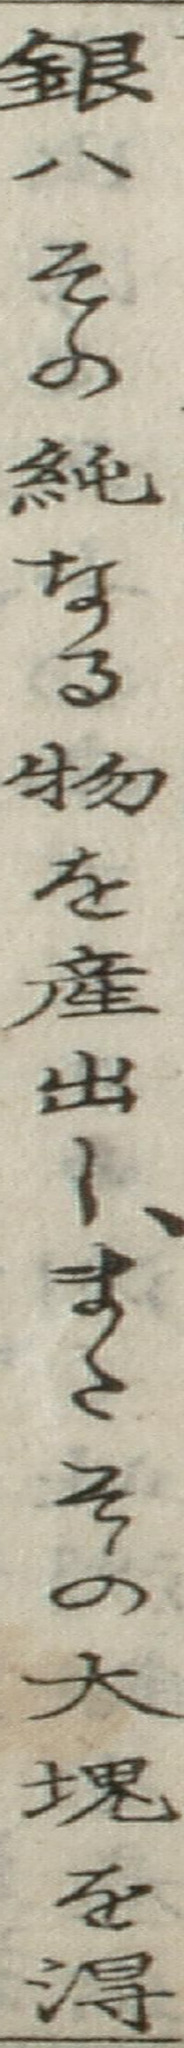銀はその純なる物を産出し、またその大塊を得
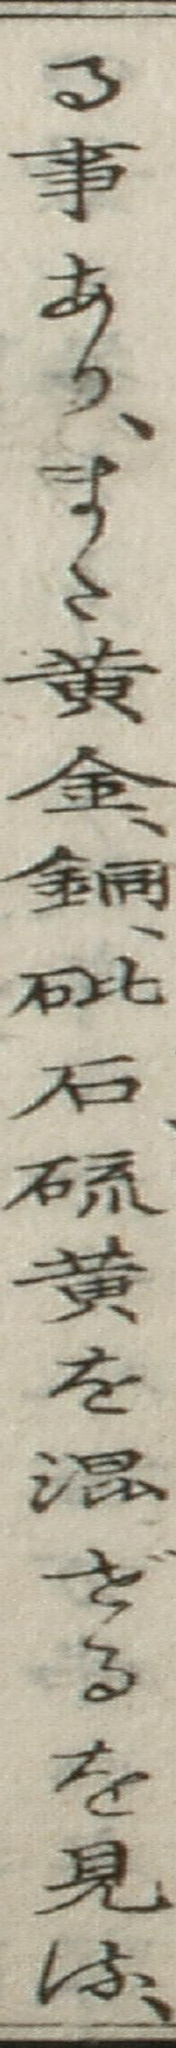る事あり、また黄金、銅、砒石、硫黄を混ずるを見る、
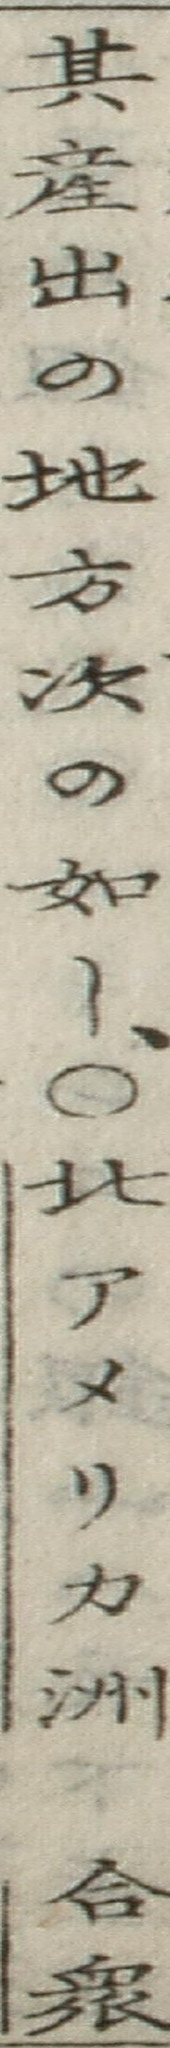其産出の地方次の如し、○北アメリカ洲合衆
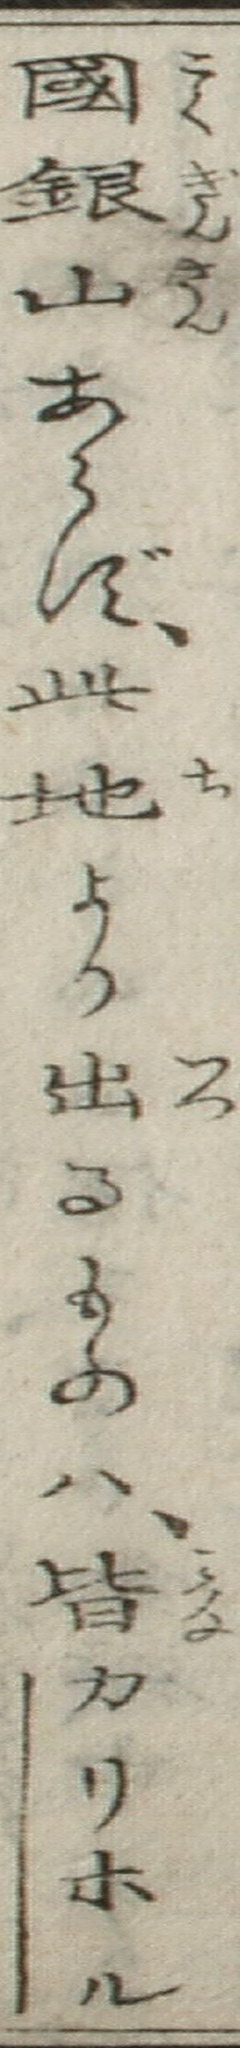国銀山あらず、此地より出るものは、皆カリホル

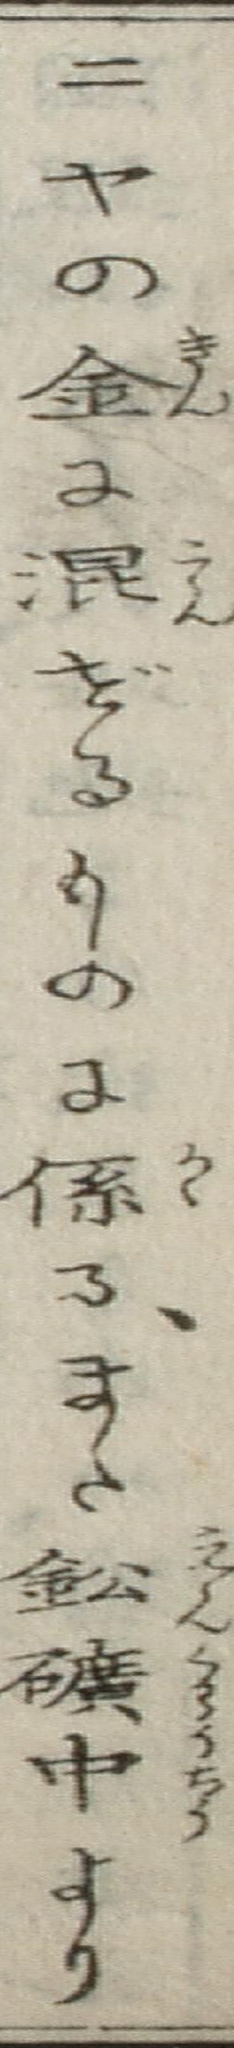ニヤの金に混ずるものに係る、また鈆砿中より
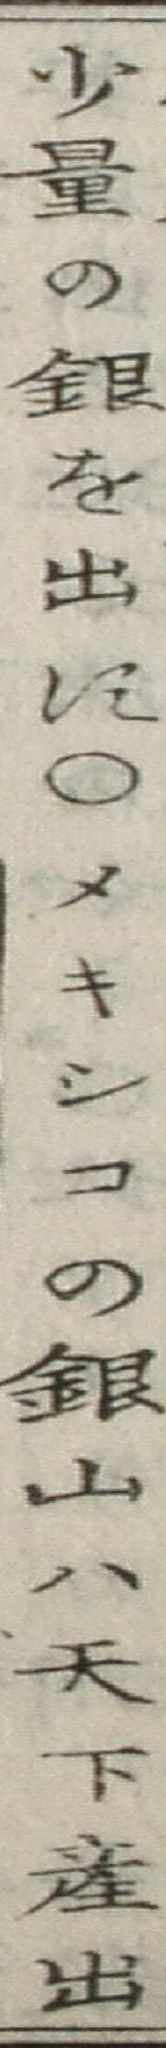少量の銀を出す、○メキシコの銀山は天下産出
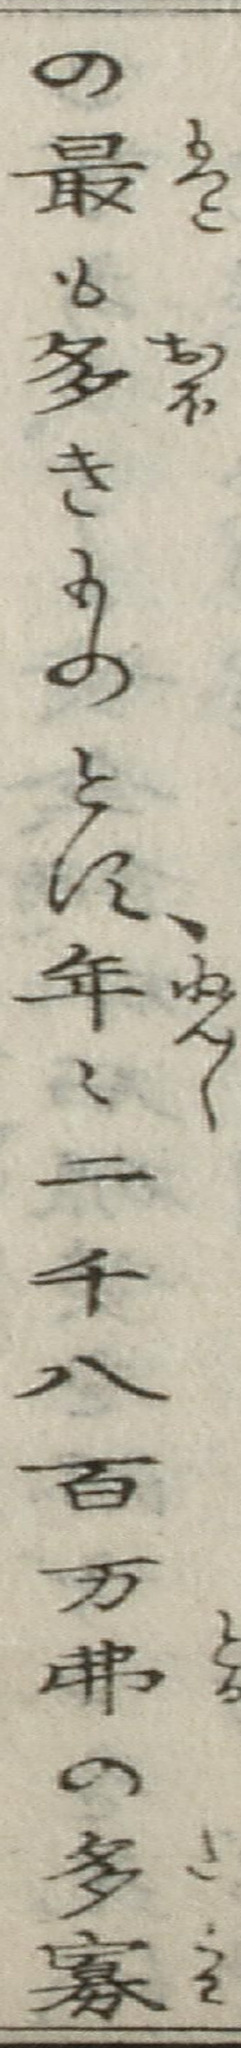の最も多きものとす、年々二千八百万弗の多寡
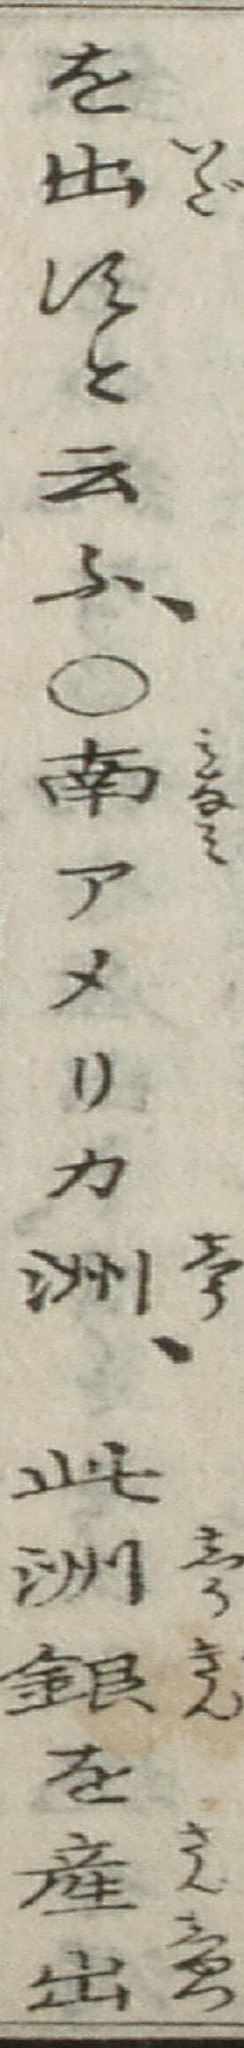を出すと云ふ、○南アメリカ洲、此洲銀を産出
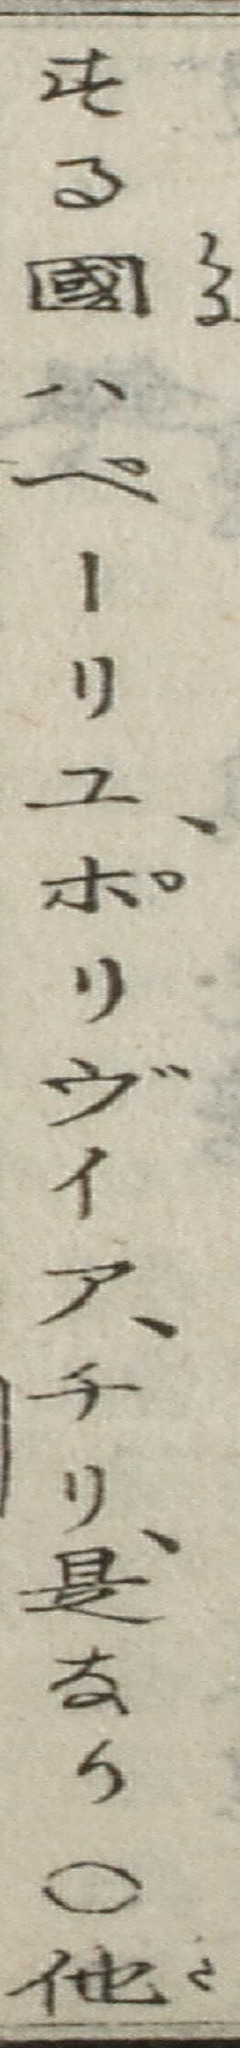する國はベーリユ、ポリヴイア、チリ、是なり○他
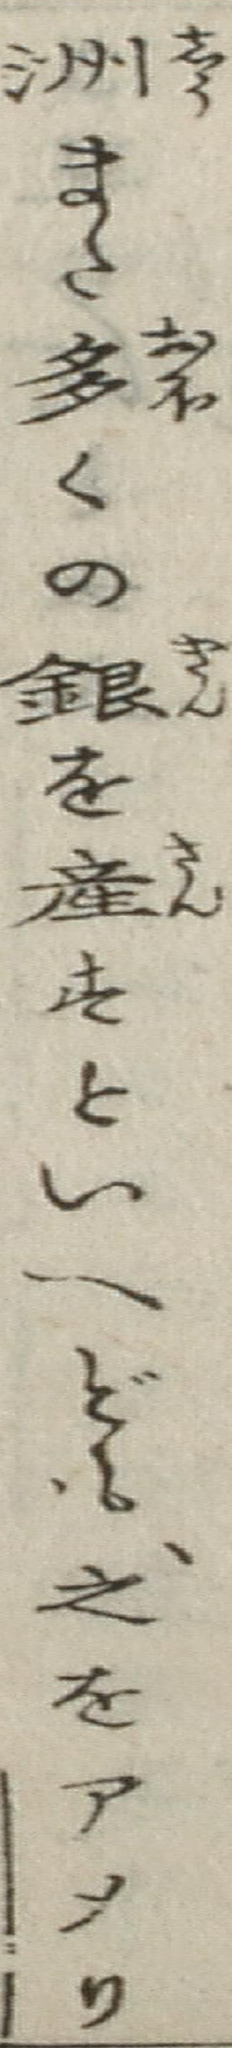洲また多くの銀を産すといへども、之をアメリ
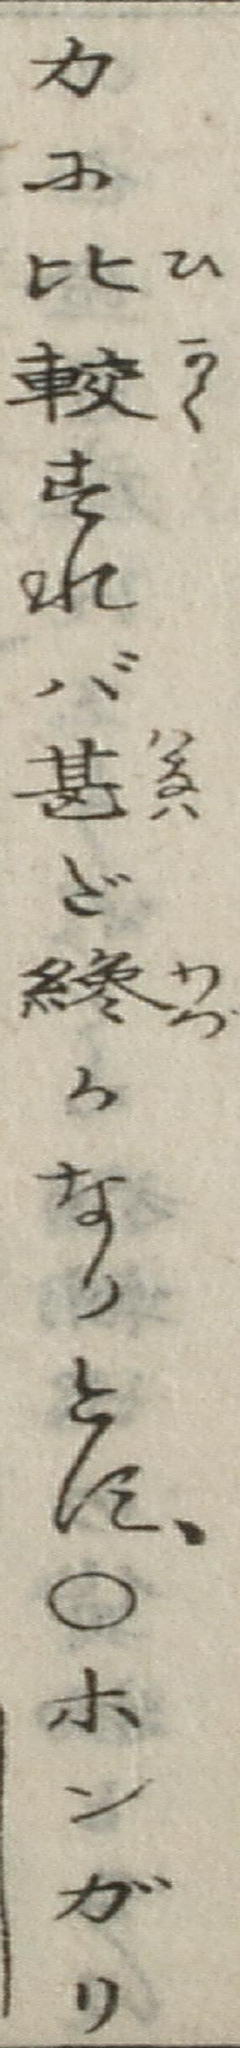カに比較すれば甚だ僅かなりとす、○ホンガリ
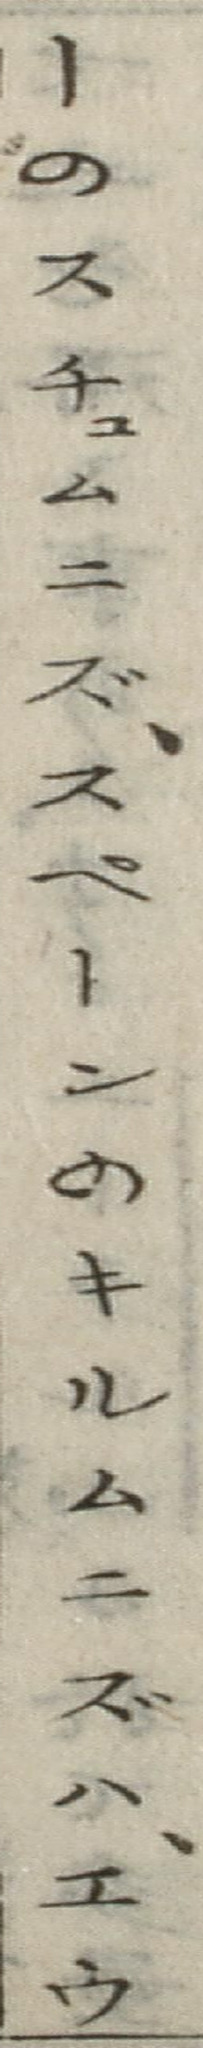ーのスチュムニズ、スペーンのキルムニズは、エウ
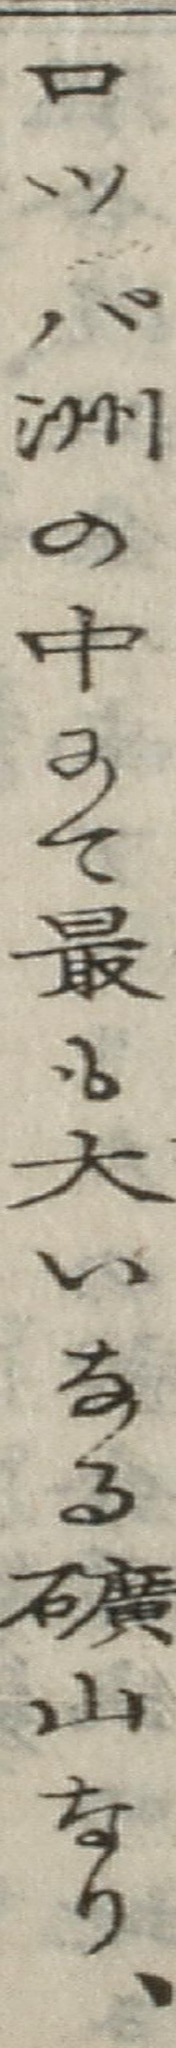ロツパ洲の中にて最も大いなる砿山なり、
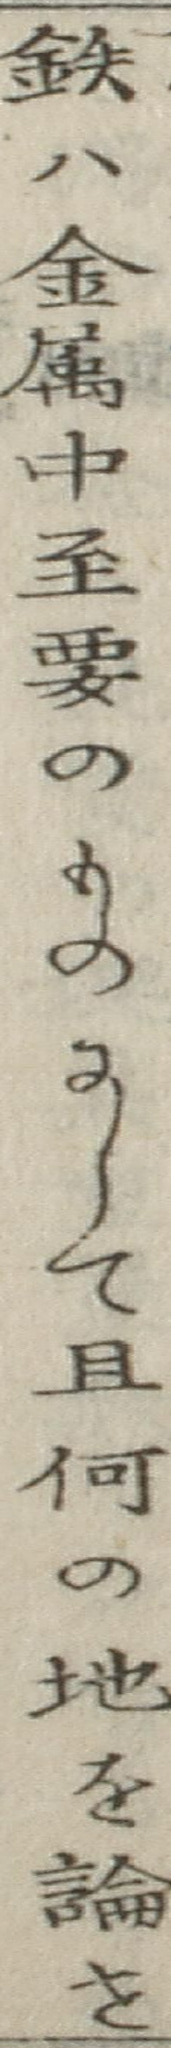鉄は金属中至要のものにして、且何の地を論せ
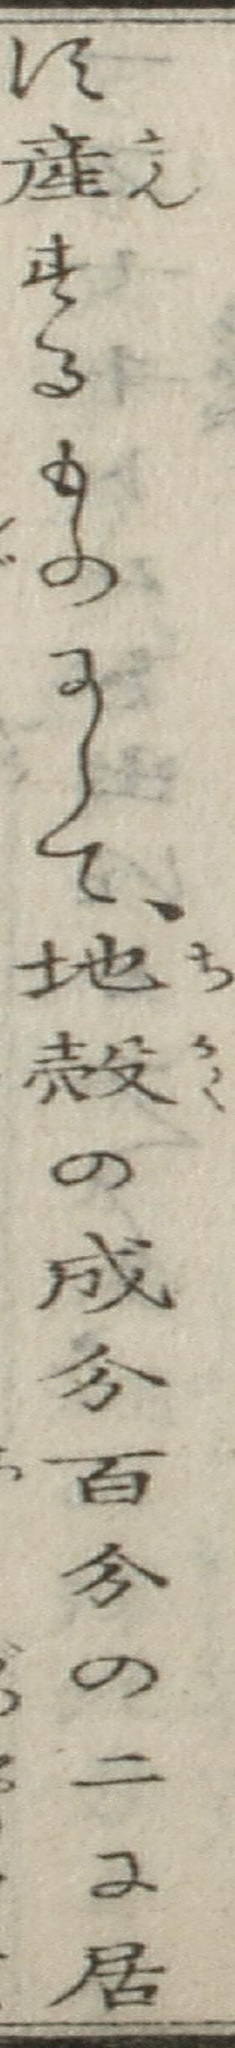す産するものにして、地殻の成分百分の二に居
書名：訓蒙　天然地理學　下
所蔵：東京大学地震研究所図書室 Earthquake Research Institute Library, The University of Tokyo, JAPAN
